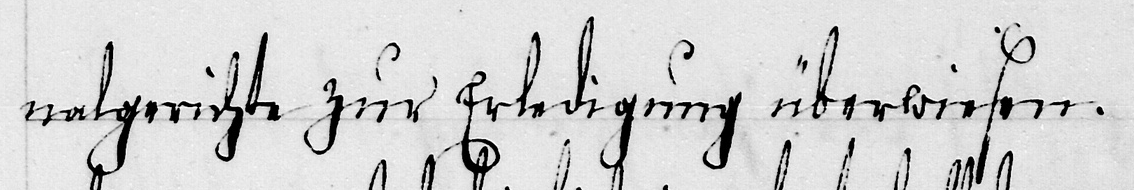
nalgerichte zur Erledigung überwiesen.
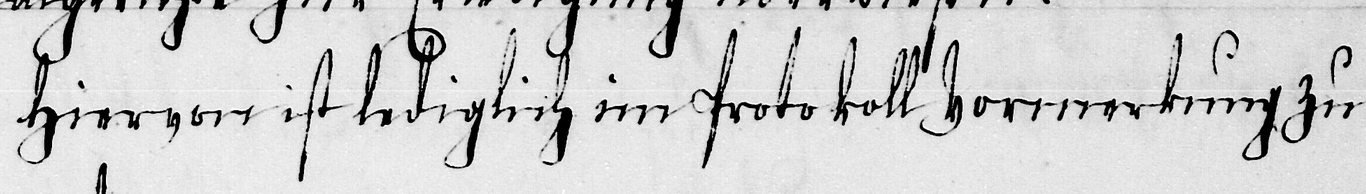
Hiervon ist lediglich im Protokoll Vormerkung zu
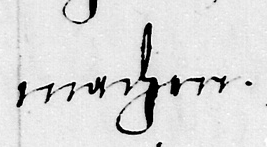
machen.
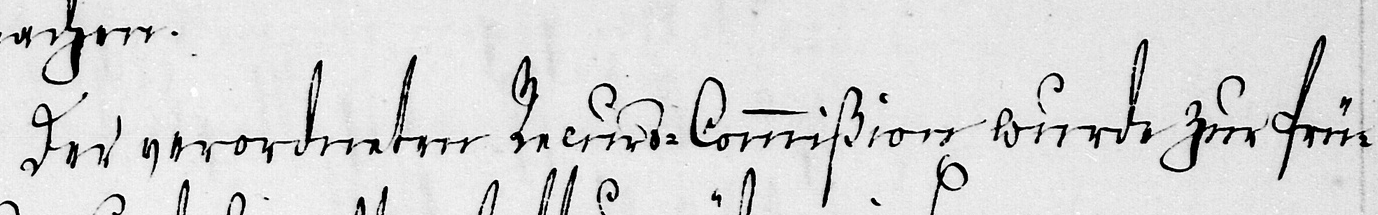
Der verordneten Recurs-Commißion wurde zur Prüf¬
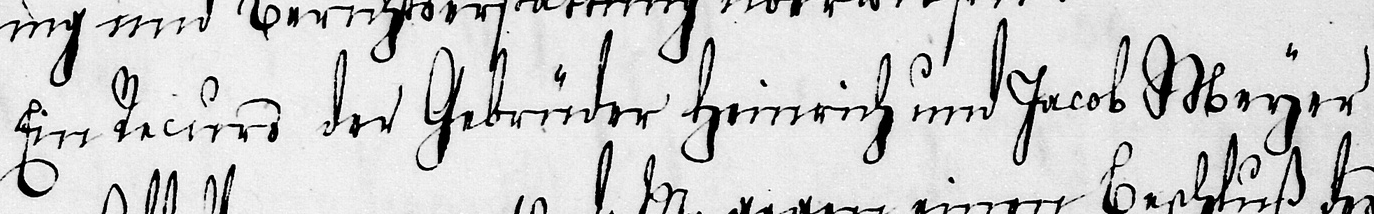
Ein Recurs der Gebrüder Heinrich und Jacob Meyer
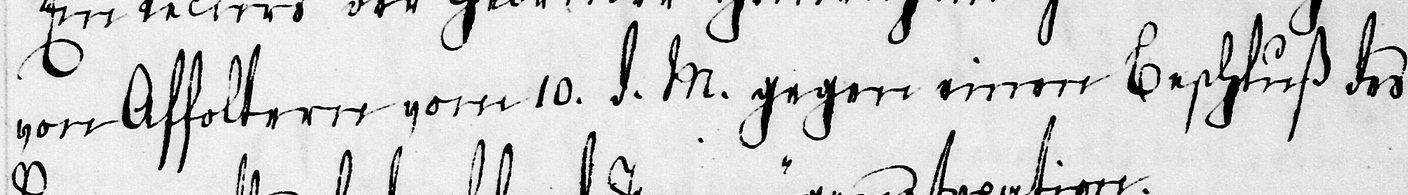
von Affoltern vom 10. d. M. gegen einen Beschluß des
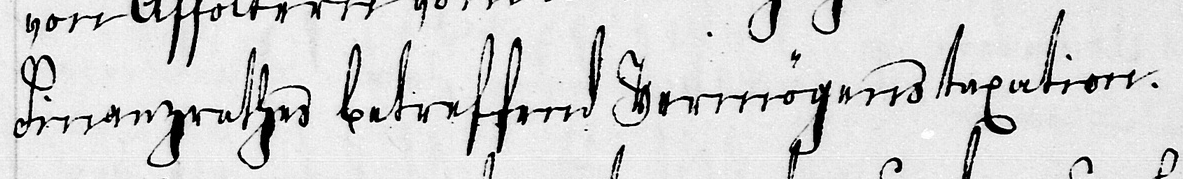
Finanzrathes betreffend Vermögenstaxation.
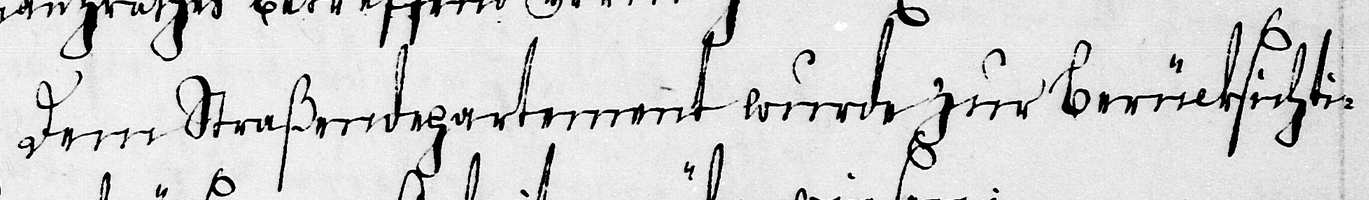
Dem Straßendepartement wurde zur Berücksichti¬
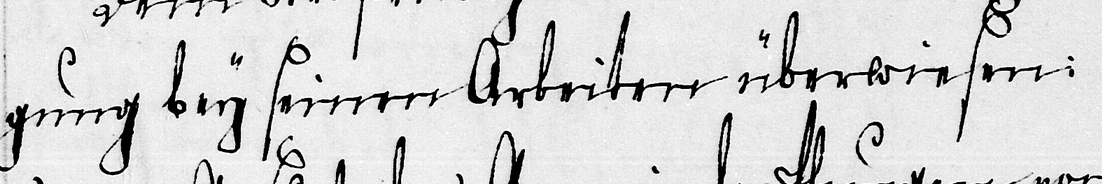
gung bey seinen Arbeiten überwiesen:
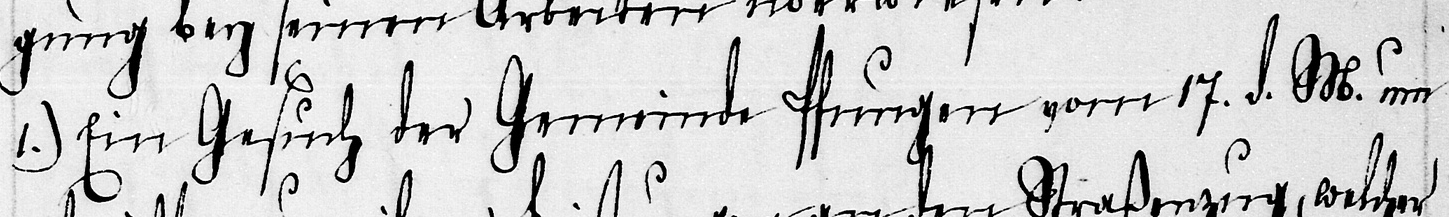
1.) Ein Gesuch der Gemeinde Pfungen vom 17. d. M. um
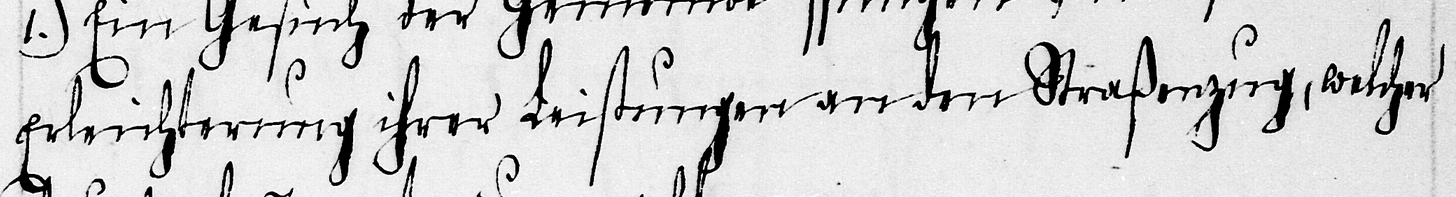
Erleichterung ihrer Leistungen an den Straßenzug, welcher
